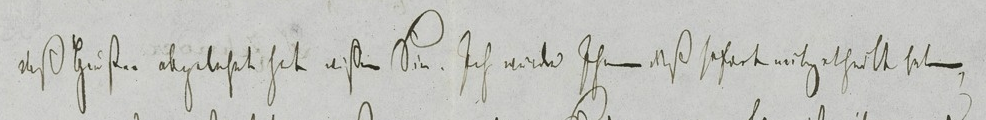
Daß Heußer abgelehnt hat wissen Sie. Ich würde Ihnen dieß sofort mitgetheilt haben,
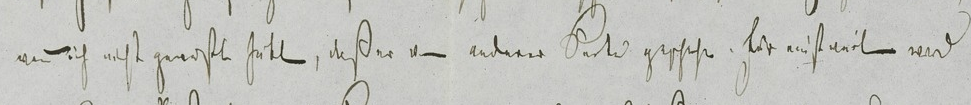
wenn ich nicht gewußt hätte, daß es von anderer Seite geschehe. Für einstweilen wird
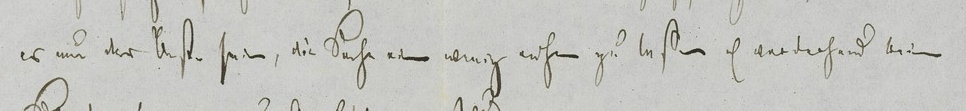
es nun das Beste sein, die Sache ein wenig ruhen zu lassen & vorderhand keine
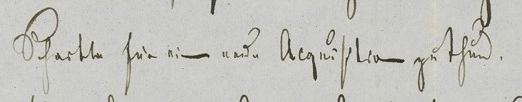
Schritte für eine neue Acquisition zu thun.
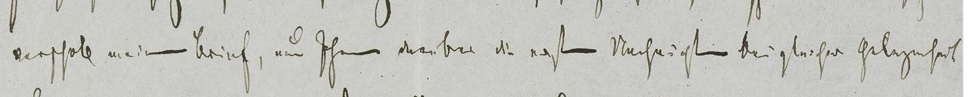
verschob meinen Brief, um Ihnen darüber die ersten Nachrichten bei gleicher Gelegenheit
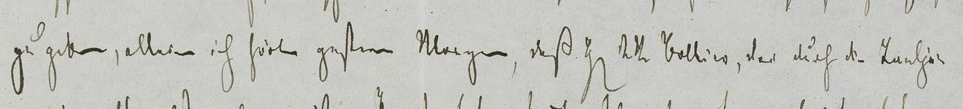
zu geben, allein ich hörte gestern Morgen, daß Herr RR Bollier, der durch die
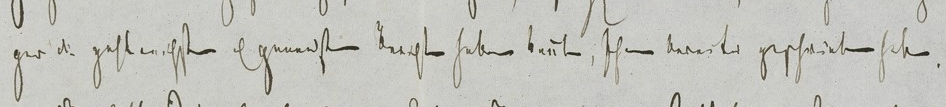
ger die zahlreichsten & genausten Berichte haben konnte, Ihnen bereits geschrieben habe.
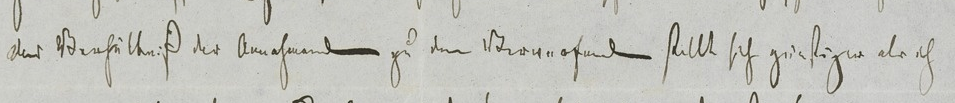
Das Verhältniß der Annehmenden zu den Verwerfenden stellt sich günstiger als ich
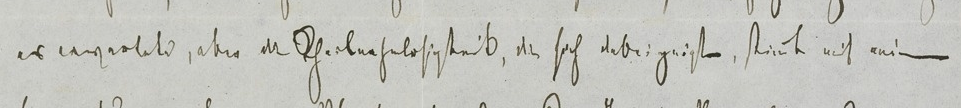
es erwartete, aber die Theilnahmlosigkeit, die sich dabei zeigte, stimmt mit mei
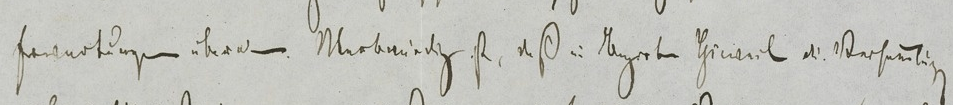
Erwartungen überein. Merkwürdig ist, daß im Bezirke Hinweil die Versammlugen
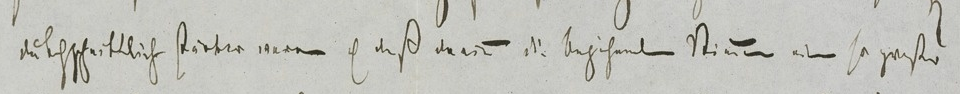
durchschnittlich stärker waren & daß darin die bejahenden Stimmen ein so großes
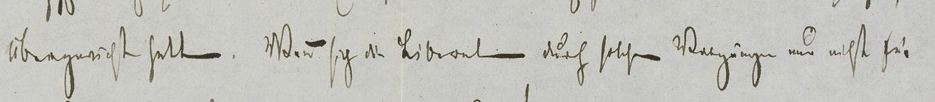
Übergewicht hatten. Wenn sich die Liberalen durch solche Vorgänge nur nicht für
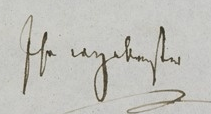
ergebenster
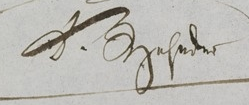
Dr. Zehnder
